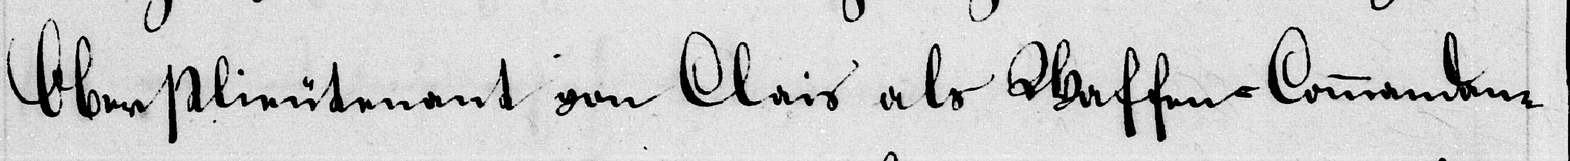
Oberlieutenant von Clais als Waffen-Commandan¬
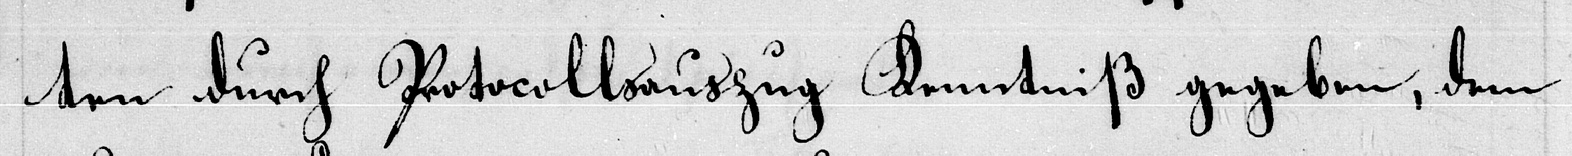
ten durch Protocollsauszug Kenntniß gegeben, dem
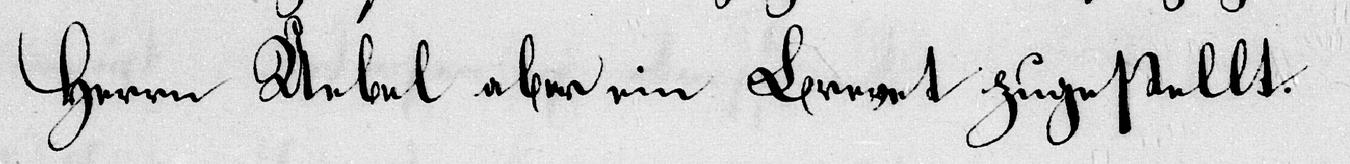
Herrn Uebel aber ein Brevet zugestellt.
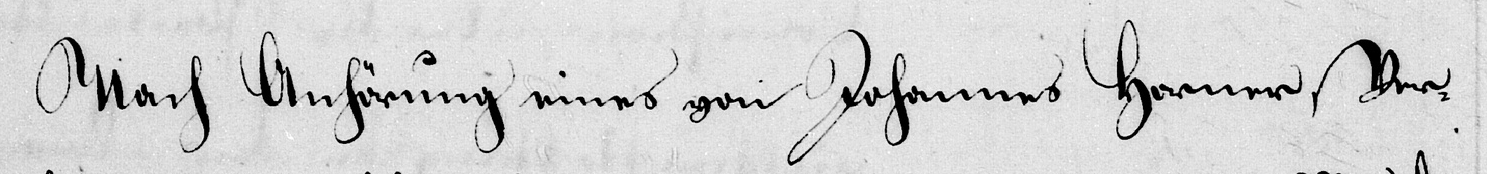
Nach Anhörung eines von Johannes Horner, Ver¬
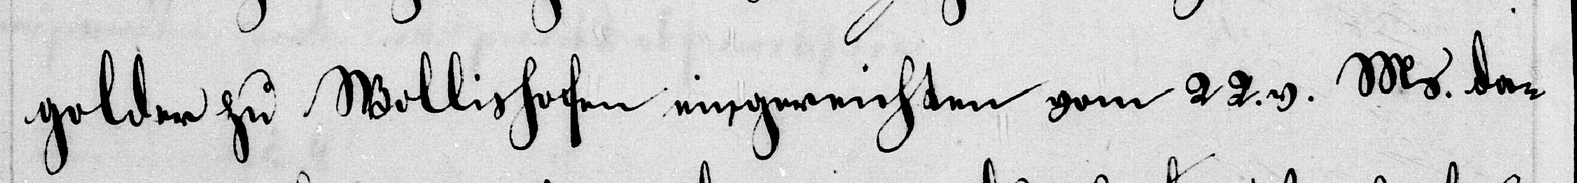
golder zu Wollishofen eingereichten vom 22. v. Ms. da¬
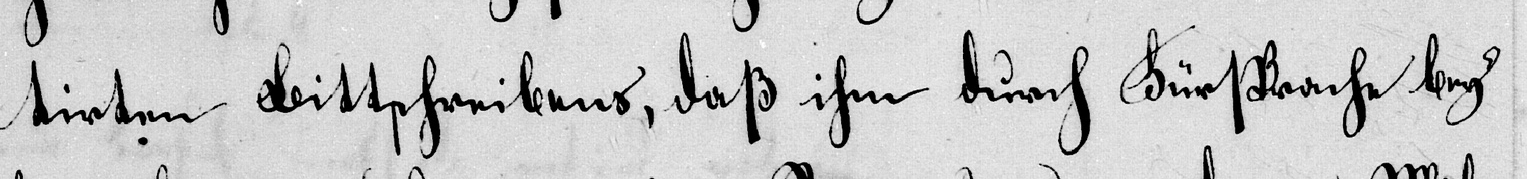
tirten Bittschreibens, daß ihm durch Fürsprache bey
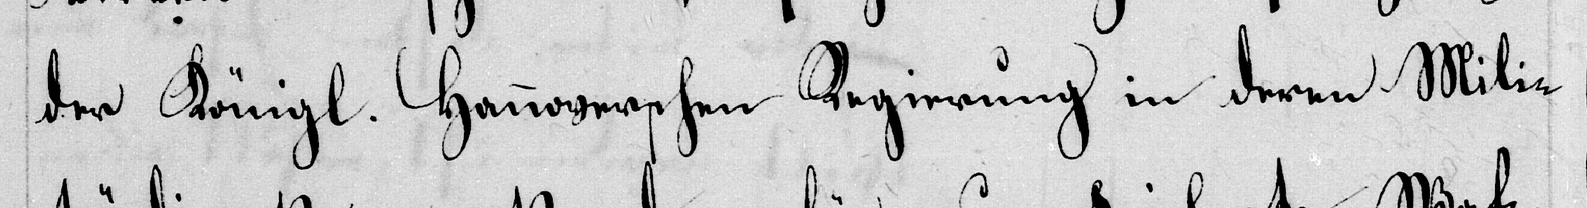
der Königl. Hannoverschen Regierung in deren Mili¬
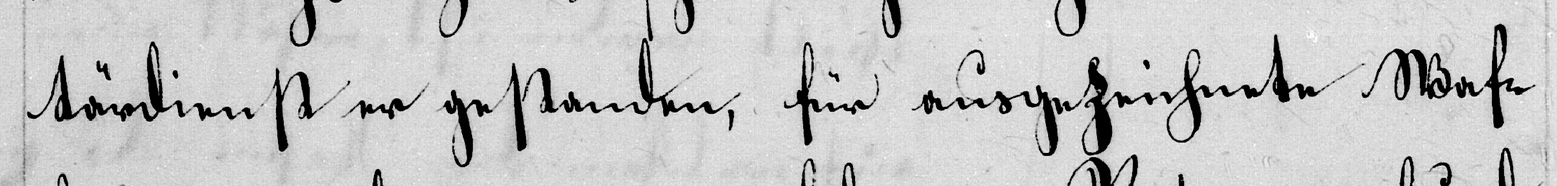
tärdienst er gestanden, für ausgezeichnete Waf¬
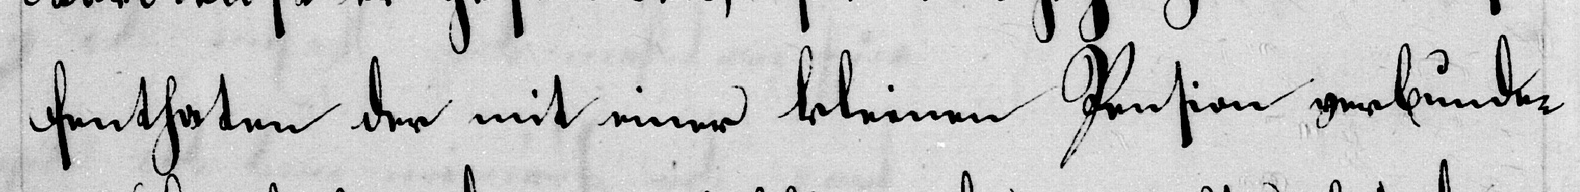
fenthaten der mit einer kleinen Pension verbunde¬
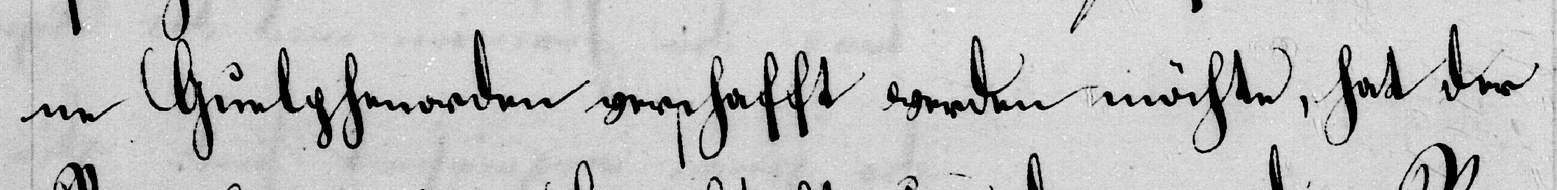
ne Guelphenorden verschafft werden möchte, hat der
